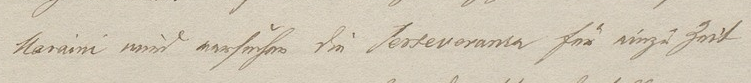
Maraini wird versuchen die Perseveranza für einige Zeit
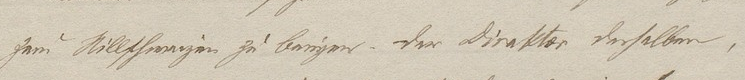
zum Stillschweigen zu bringen. Der Direktor derselben,
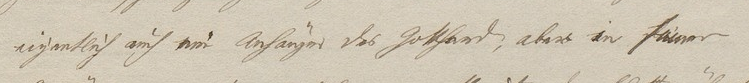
eigentlich auch ein Anhänger des Gotthard, aber in seinen
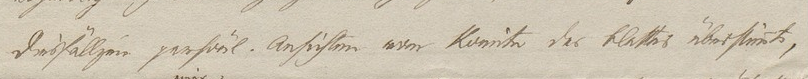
diesfälligen persönl. Ansichten vom Komitee des Blattes überstimmt,
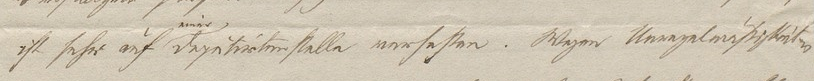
ist sehr auf eine Deputirtenstelle verseßen. Wegen Unregelmäßigkeiten
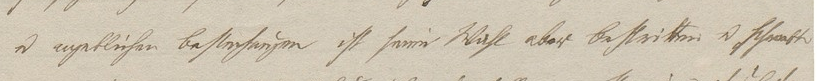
& angeblichen Bestechungen ist seine Wahl aber bestritten & schwebt
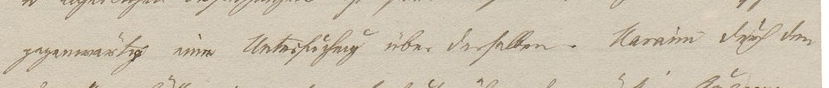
gegenwärtig eine Untersuchung über derselben. Maraini durch den
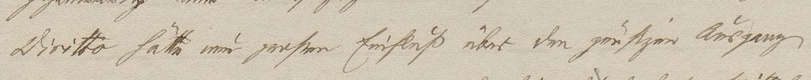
Diritto hätte nun großen Einfluß über den günstigen Ausgang
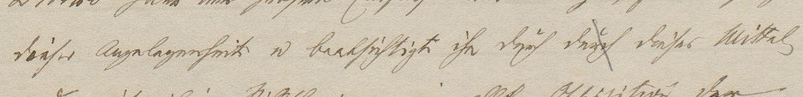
dieser Angelegenheit & beabsichtigt ihn durch durch dieses Mittel
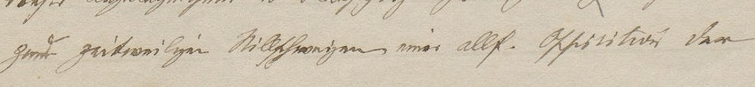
zum zeitweiligen Stillschweigen einer allf. Opposition der
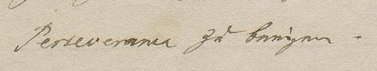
Perseveranza zu bringen.
